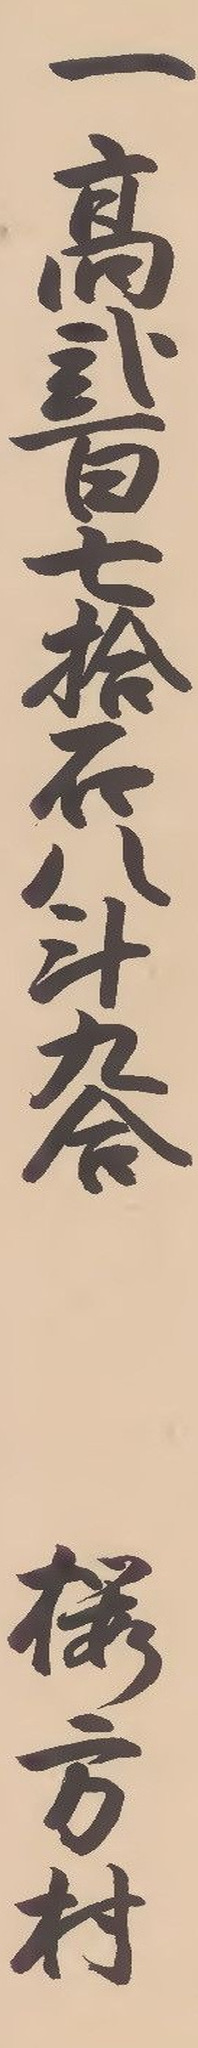一高弐百七拾石八斗九合桜方村
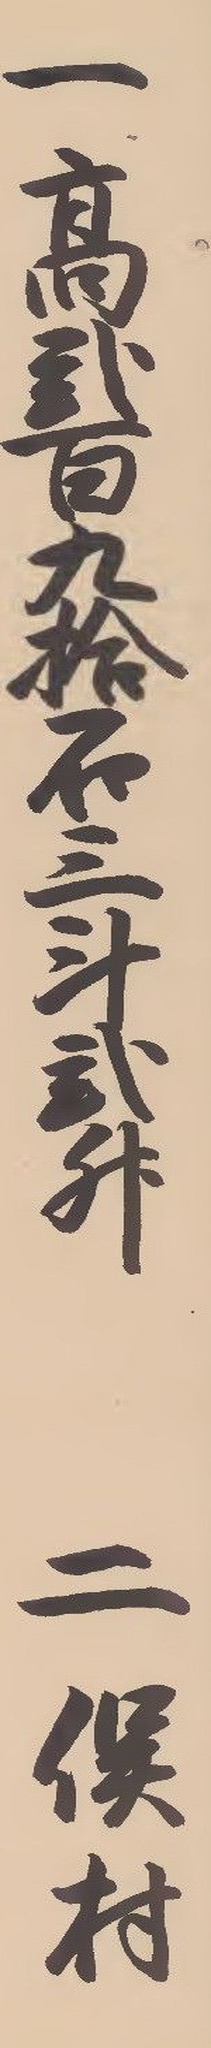一高弐百九拾石三斗弐升二俣村
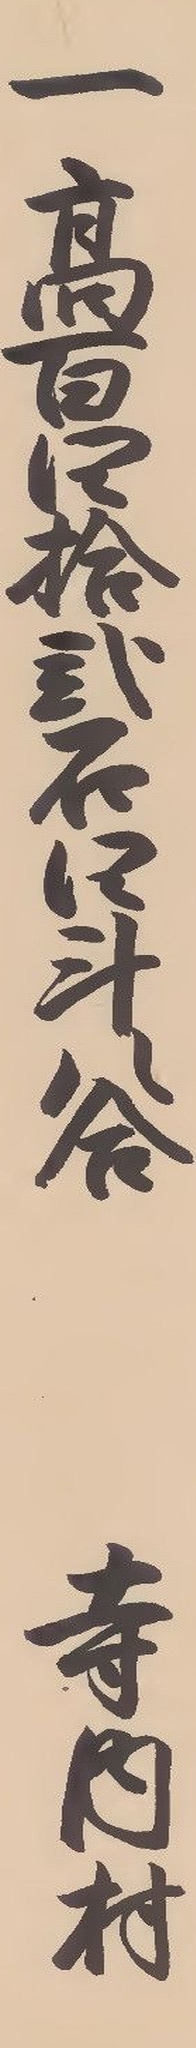一高百四拾弐石四斗八合寺内村
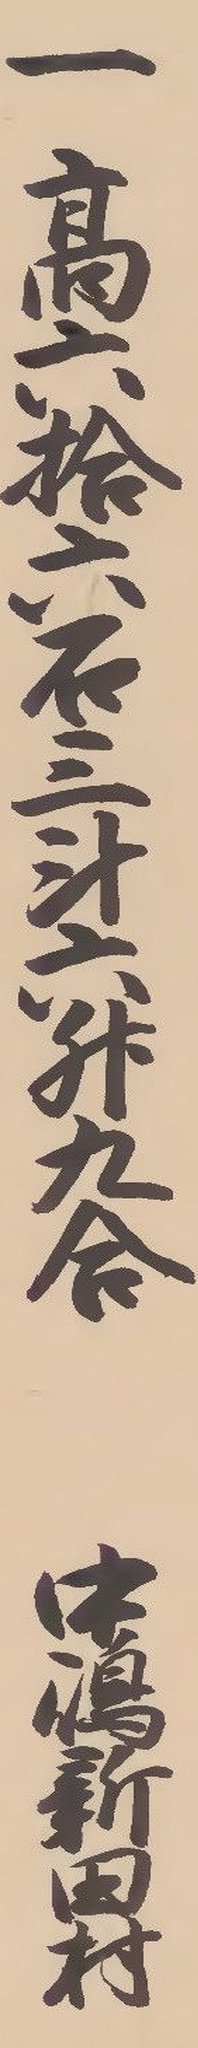一高六拾六石三斗六升九合中島新田村

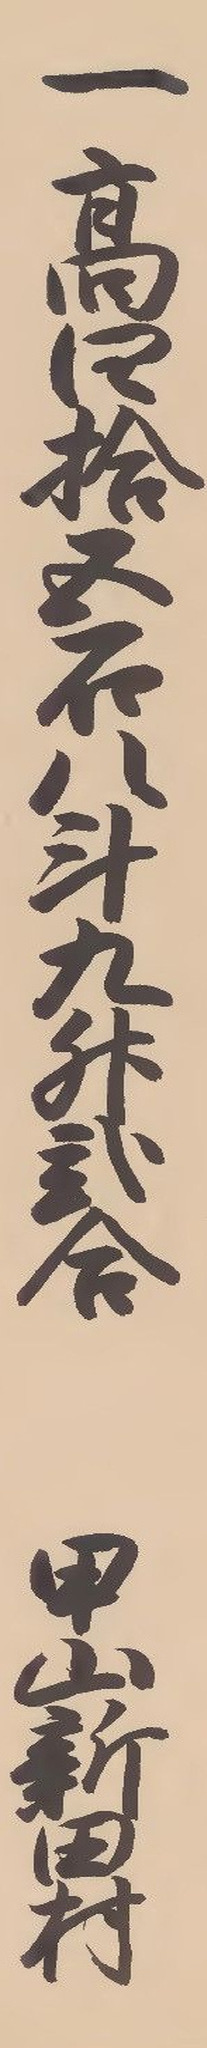一高四拾五石八斗九升弐合甲山新田村
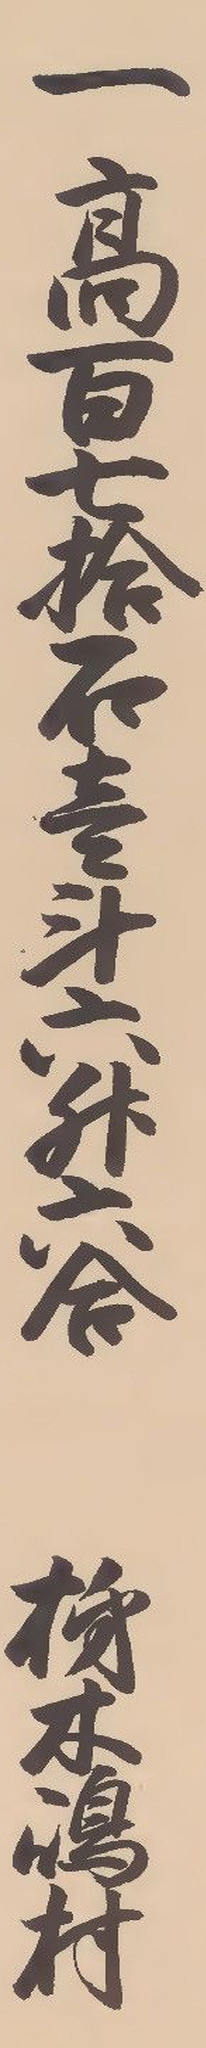一高百七拾石壱斗六升六合柿木島村
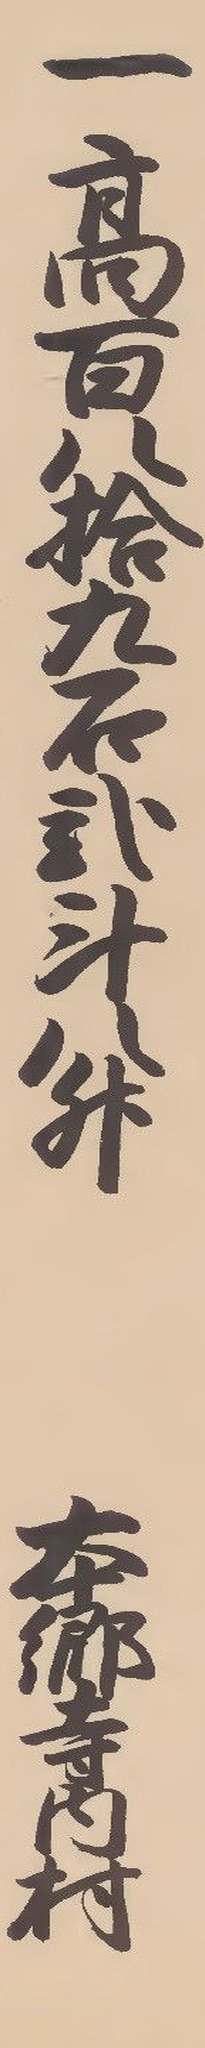一高百八拾九石弐斗八升本郷寺内村
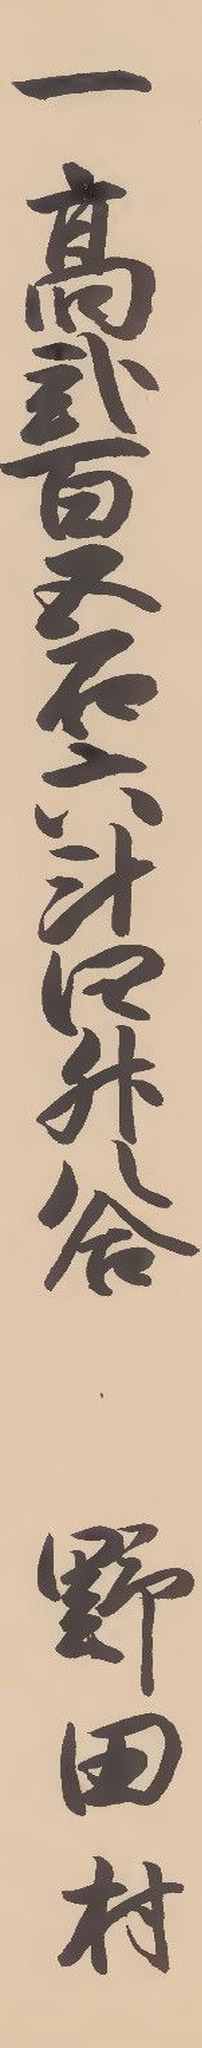一高弐百五石六斗四升八合野田村
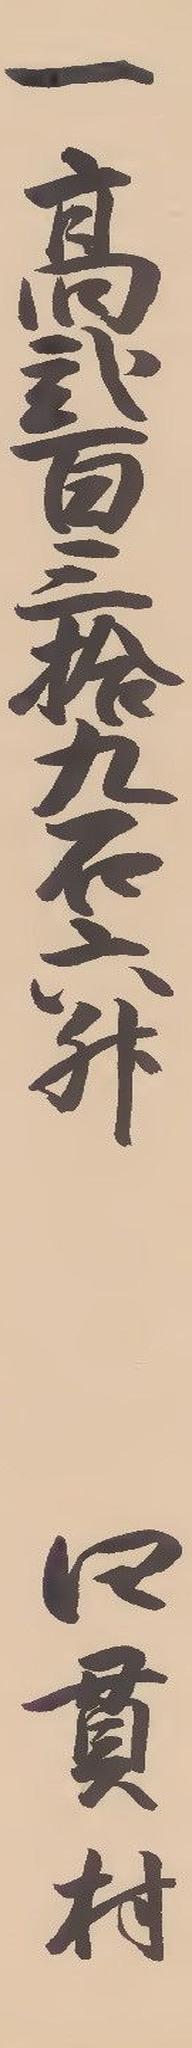一高弐百三拾九石六升四貫村

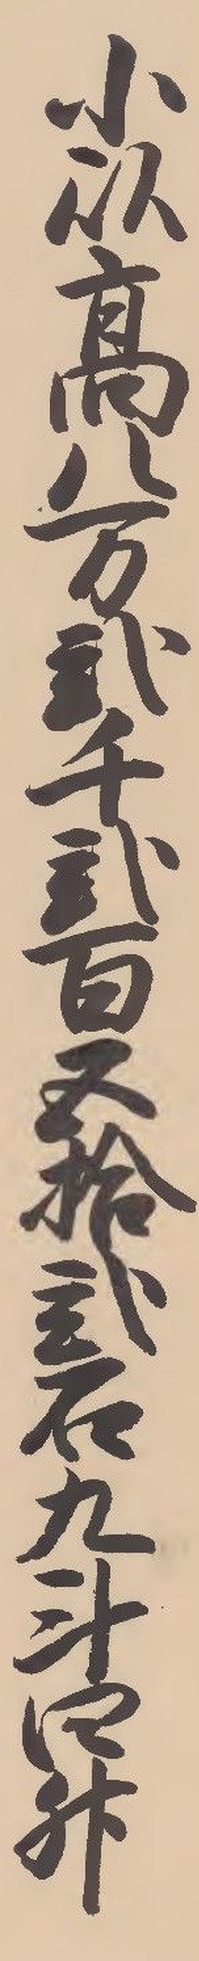小以高八万弐千弐百五拾弐石九斗四升
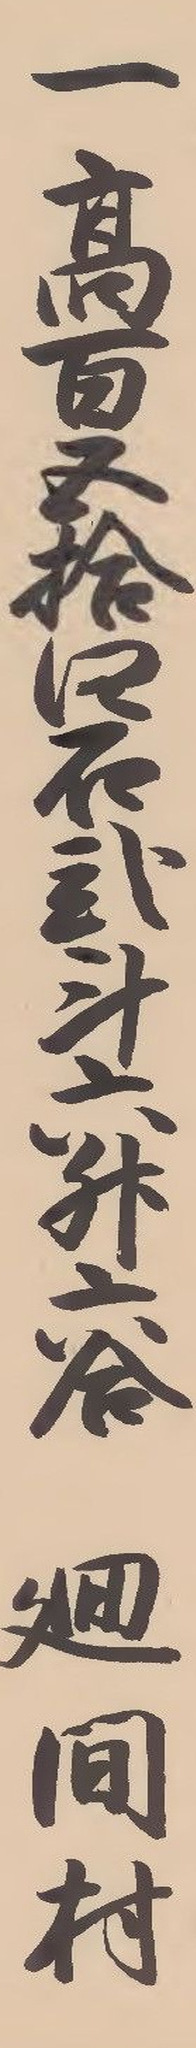一高百五拾四石弐斗六升六合廻間村
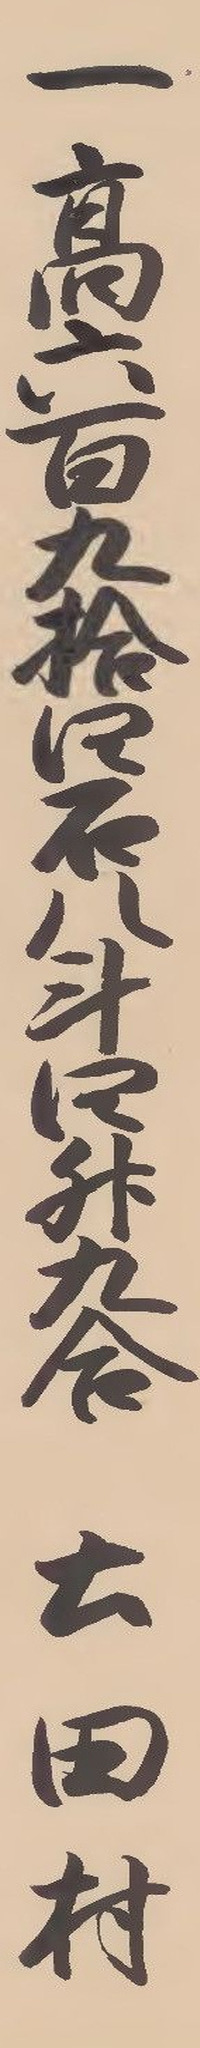一高六百九拾四石八斗四升九合土田村
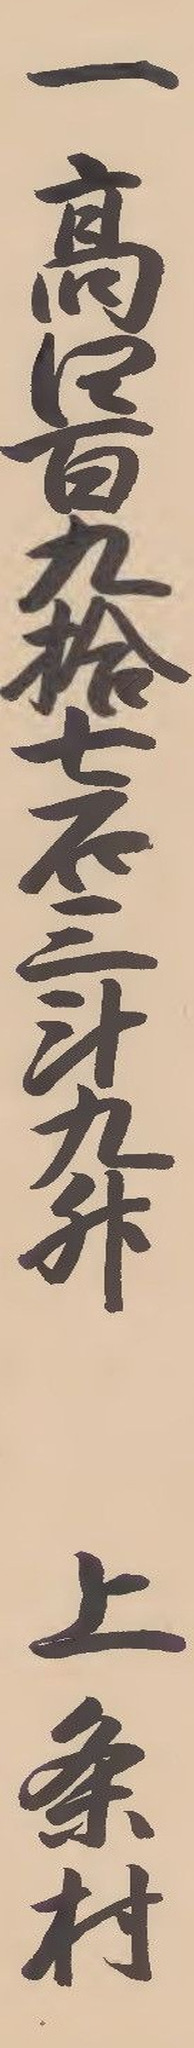一高四百九拾七石三斗九升上条村

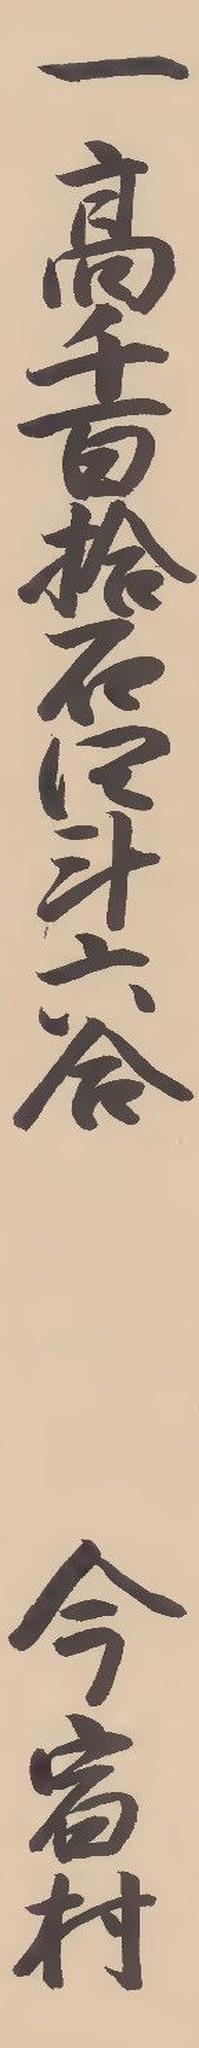一高千百拾石四斗六合今宿村
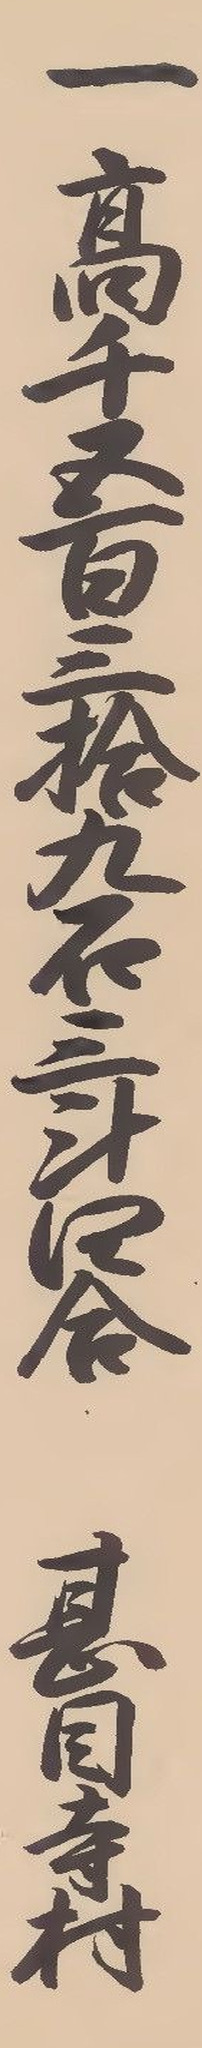一高千五百三拾九石三斗四合甚目寺村
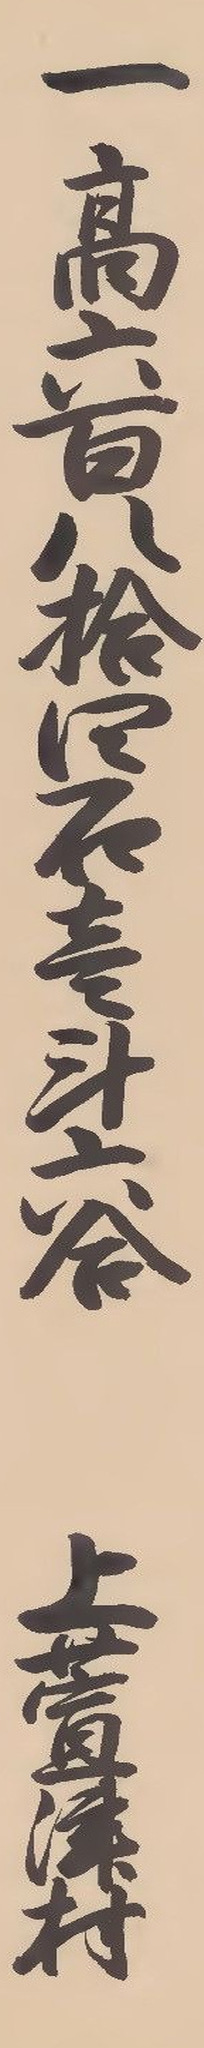一高六百八拾四石壱斗六合上萱津村
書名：尾張国郷帳
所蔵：国立公文書館 National Archives of Japan
